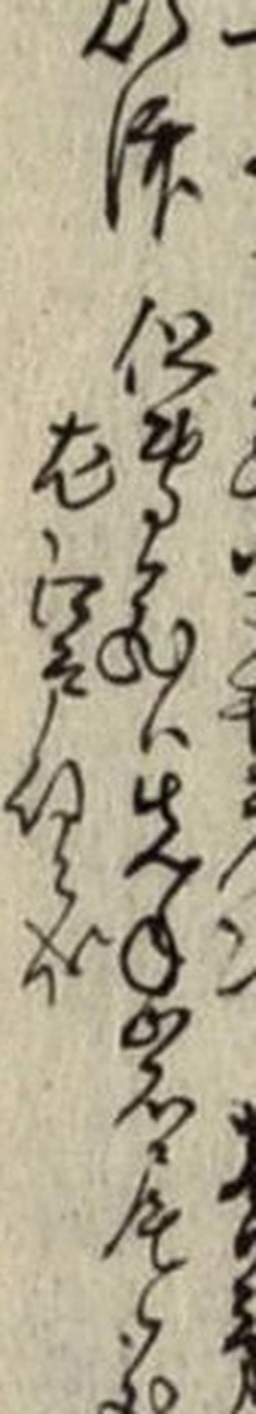尤江戸伺ニ成
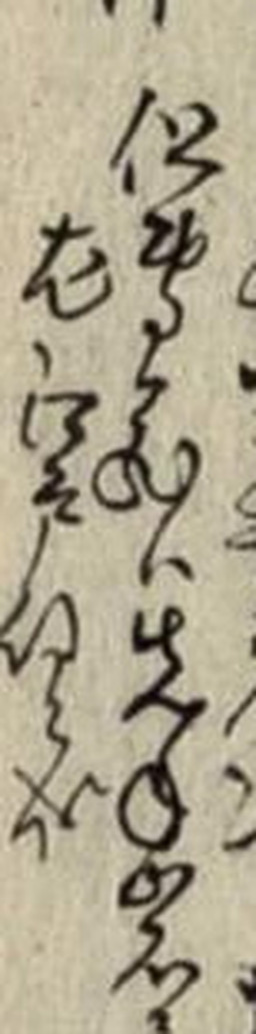尤江戸伺ニ成

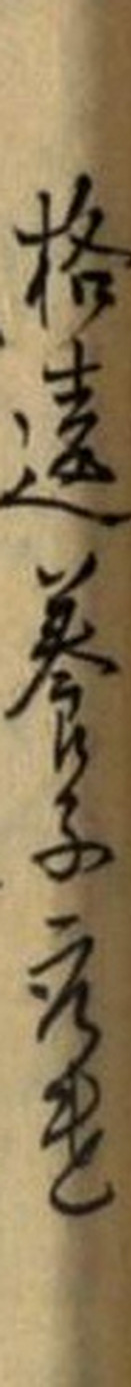格違養子取遣
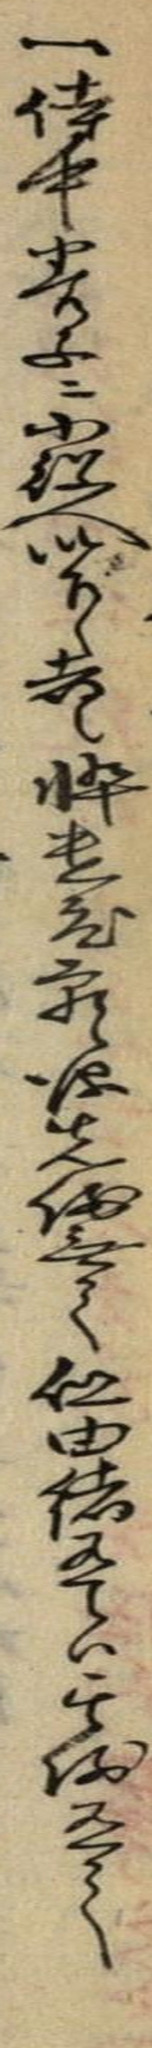一侍中養子に小役人以下之者之悴遣度願之儀先例無之但由緒有之は其例有之
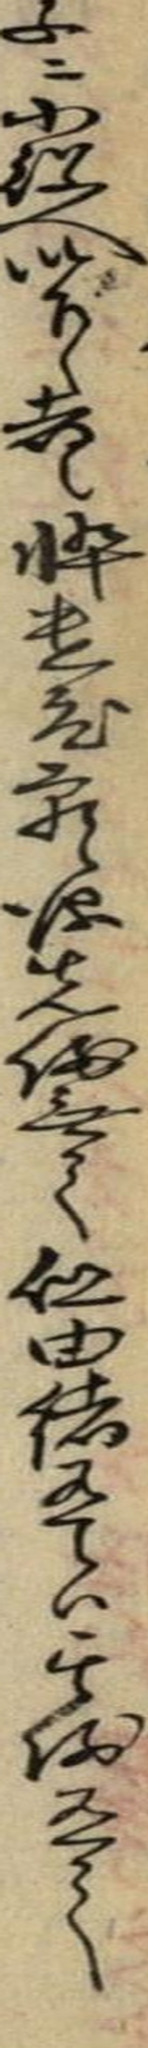一侍中養子に小役人以下之者之悴遣度願之儀先例無之但由緒有之は其例有之
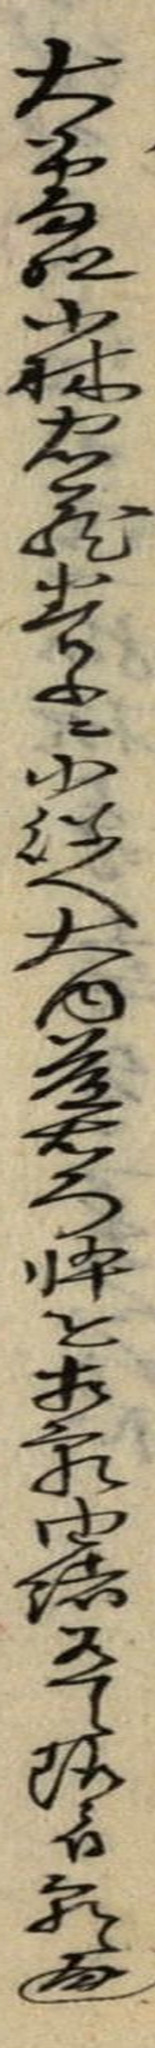一大御番組小林忠蔵養子に小役人大内藤右衛門倅を相願由緒有之趣に付願之通
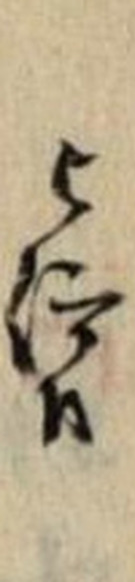被仰付
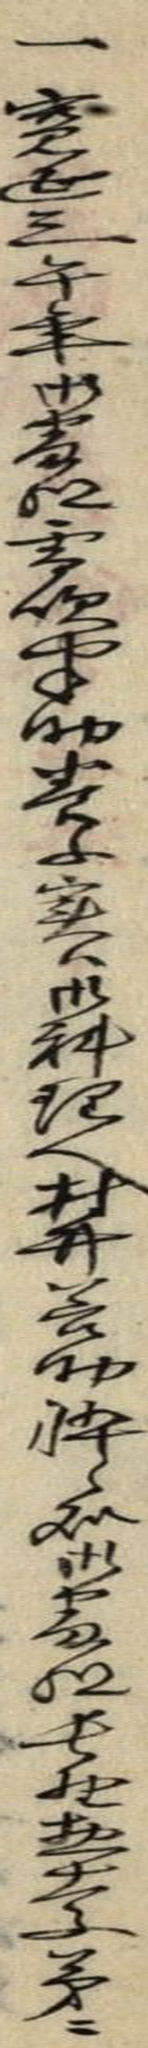一寛延三午年御番組雪吹半助養子実は御料理人村井善助倅之処御番組長野惣太夫弟に
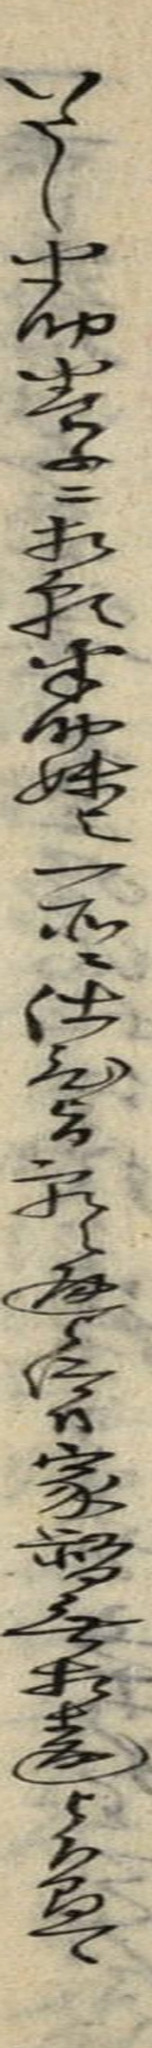いたし半助養子に相願半助妹と一所に仕度旨願之通被仰付家督無相違被下置候
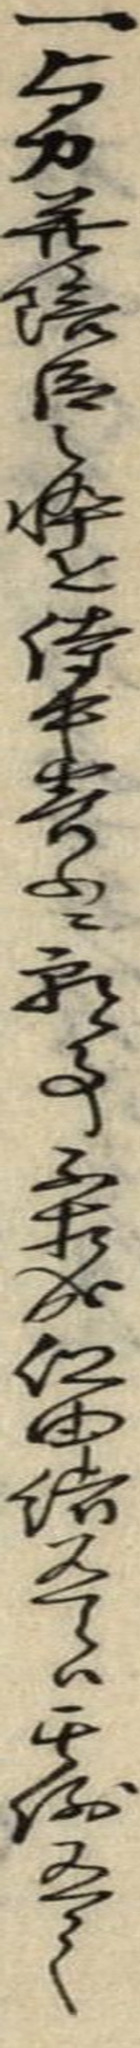一与力並陪臣之倅を侍中養子に願候事不相成但由緒有之は其例有之
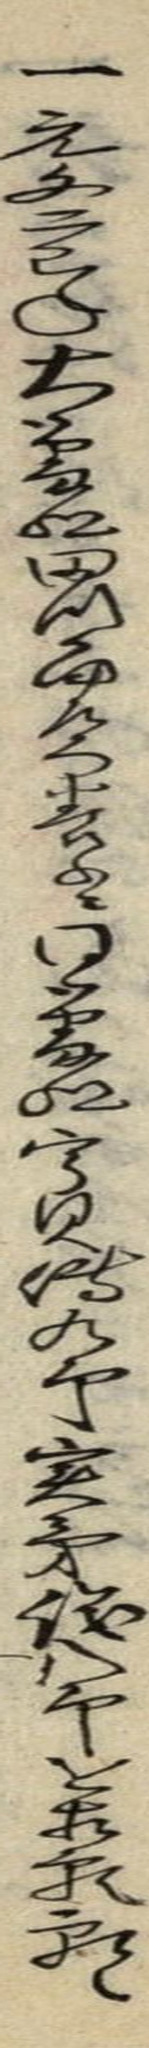一元文二巳年大御番組田川角左衛門養子に同御番組宇貝伝九郎実弟儀八郎を相願願之
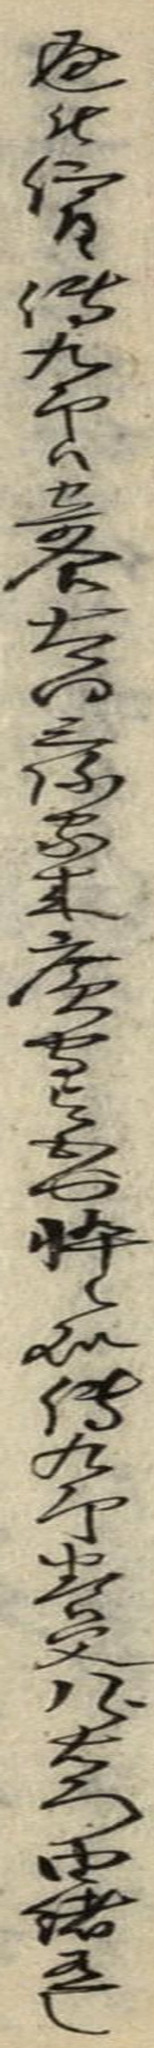通被仰付候傳九郎は寄合太田三弥家来広守与五右衛門倅之処傳九郎養父八郎右衛門由緒有之
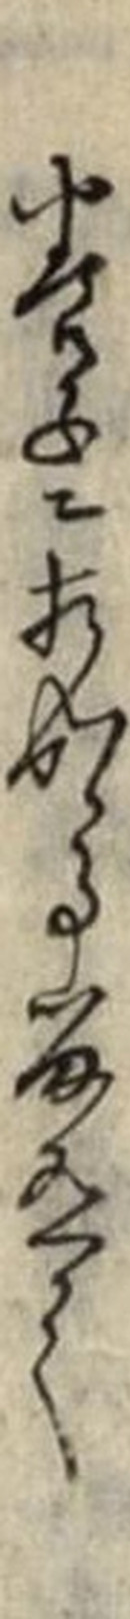養子に相成候事留有之
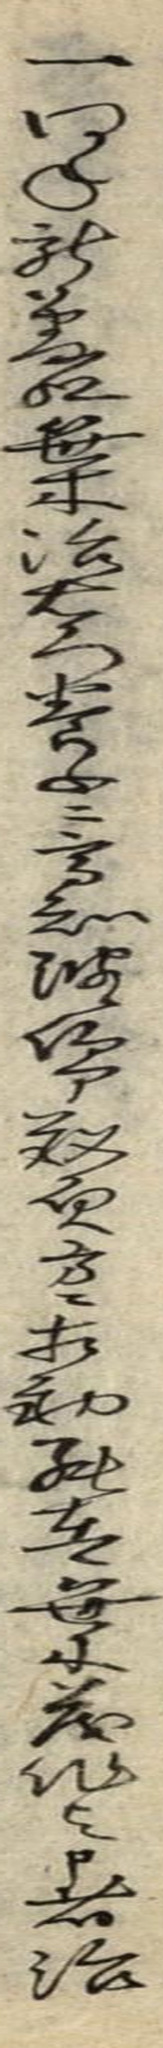一同年新御番組笹木治右衛門養子に高知波々伯部靱負方に相勤罷在候笹木茂作と申者治
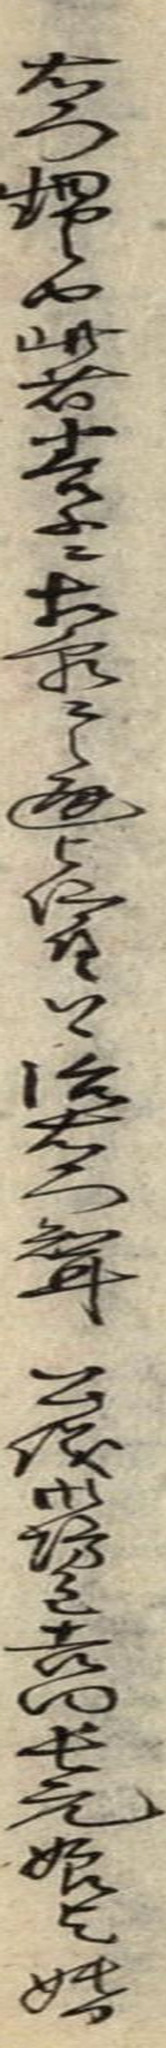右衛門甥之由此者養子に相願々之通被仰付候はゝ治右衛門婿公儀御坊主吉田長元娘と婚
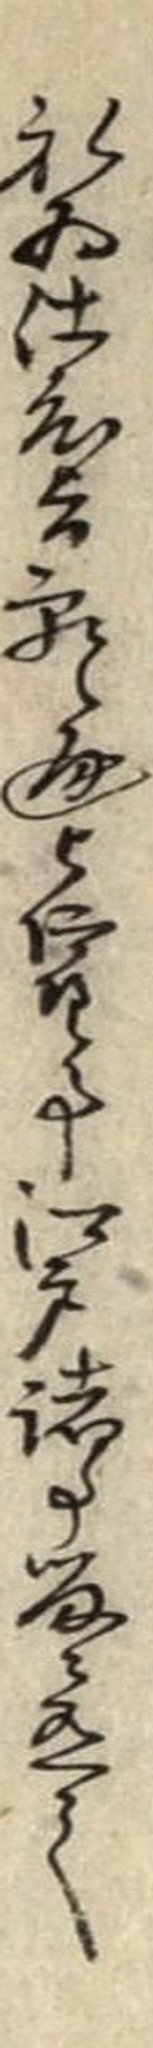礼為仕度旨願之通被仰付候事江戸諸事留に有之
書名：養子縁組之部
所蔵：福井県文書館 Fukui Prefectural Archives
